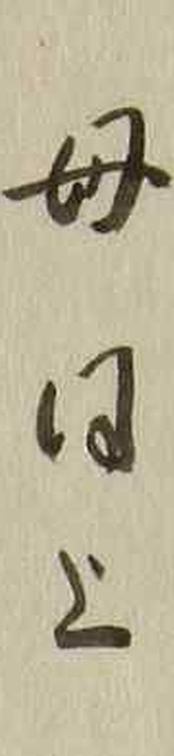母同上
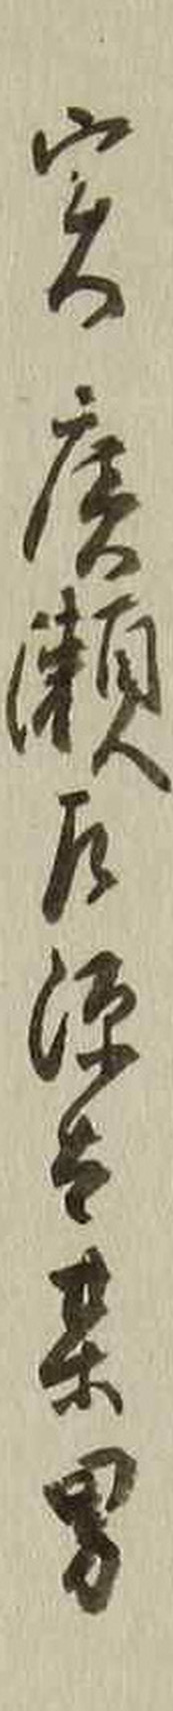実広瀬左源太某男
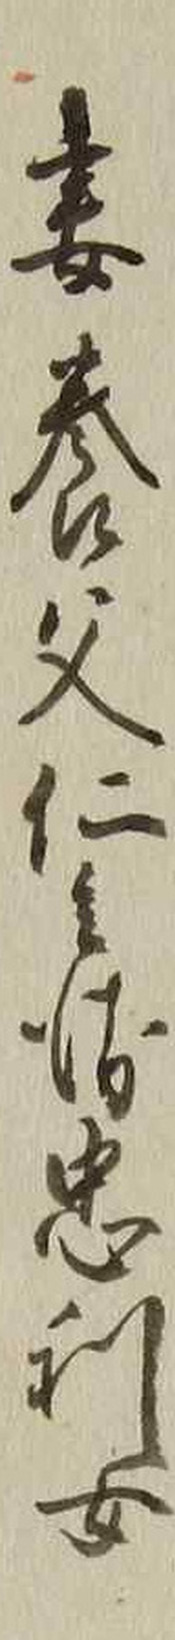妻養父仁兵衛忠利女
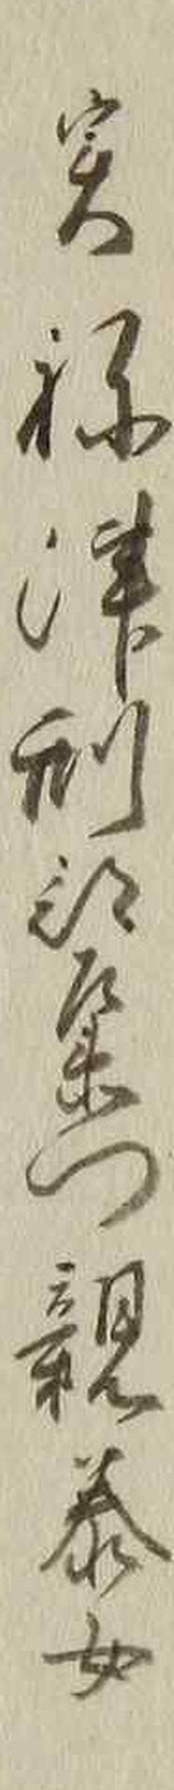実祢津刑部左衛門親泰女
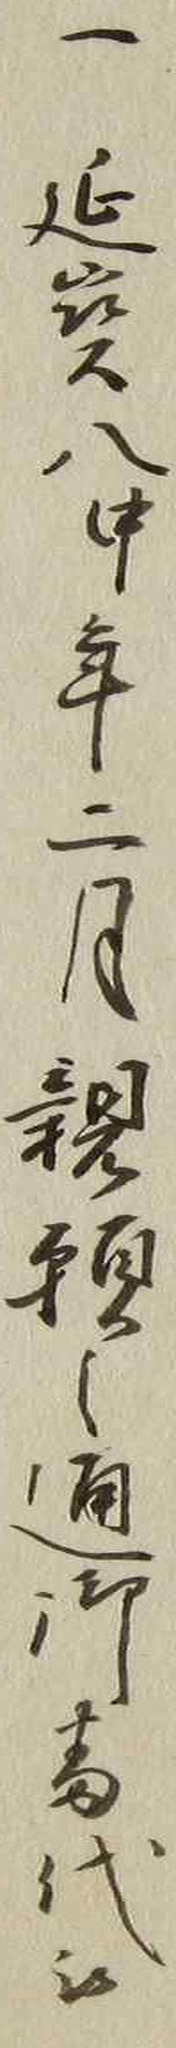一延宝八申年二月親願之通御番代被
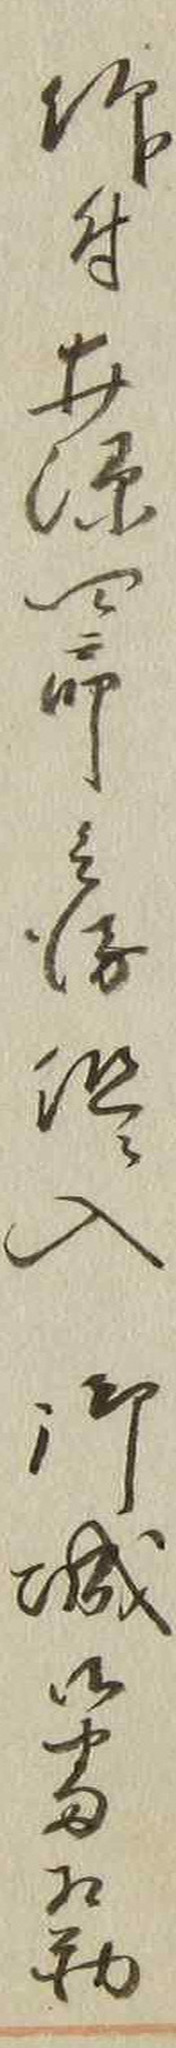仰付井深四郎兵衛組ニ入御城御番相勤
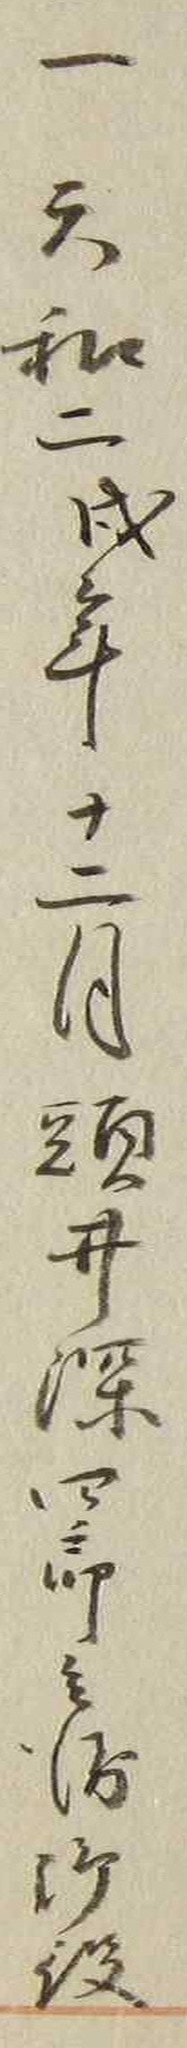一天和二戌年十二月頭井深四郎兵衛御役
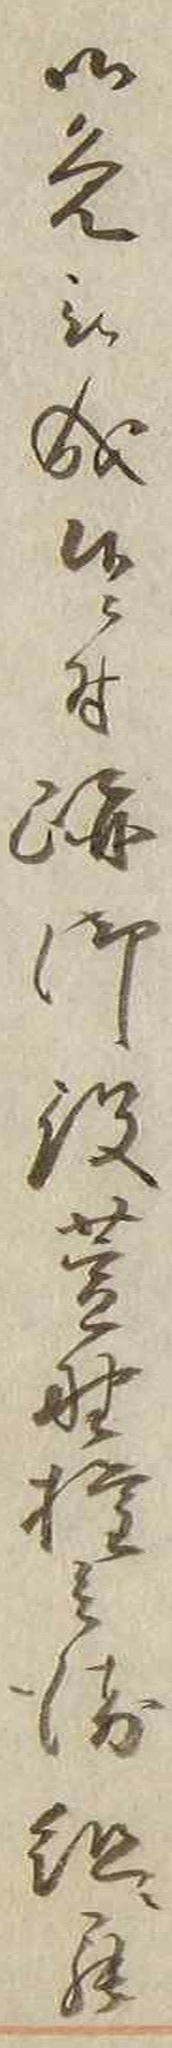御免被成候ニ付跡御役菅野権兵衛組ニ罷
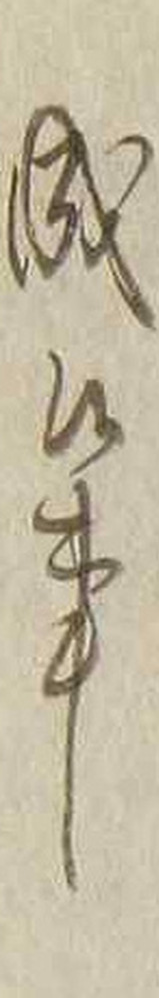成候事

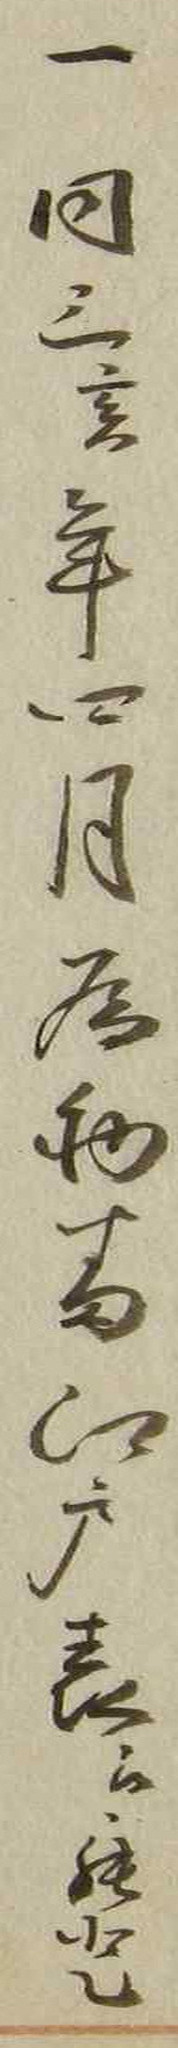一同三亥年四月為勤番江戸表江罷登
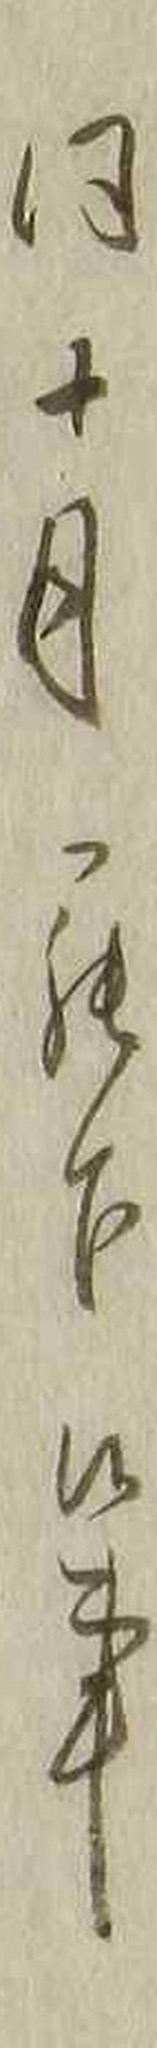同十月罷下候事
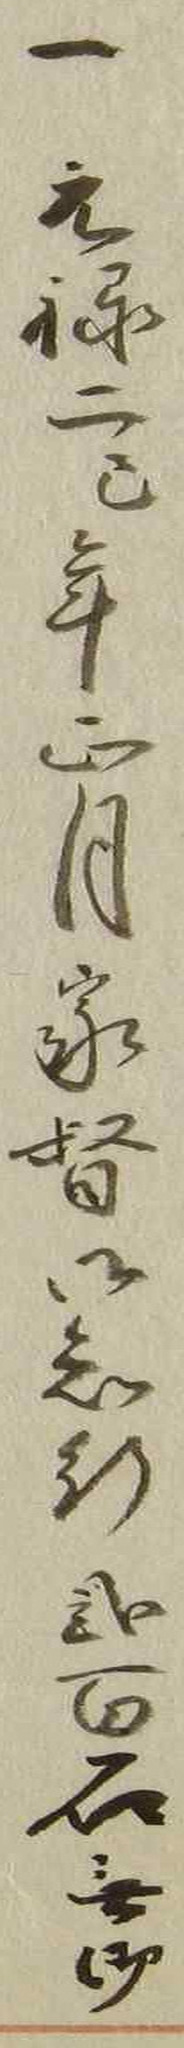一元禄二巳年正月家督御知行弐百石無御
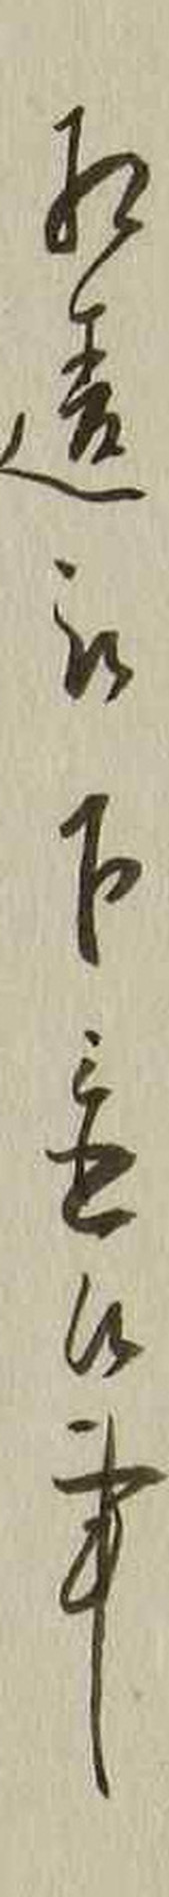相違被下置候事
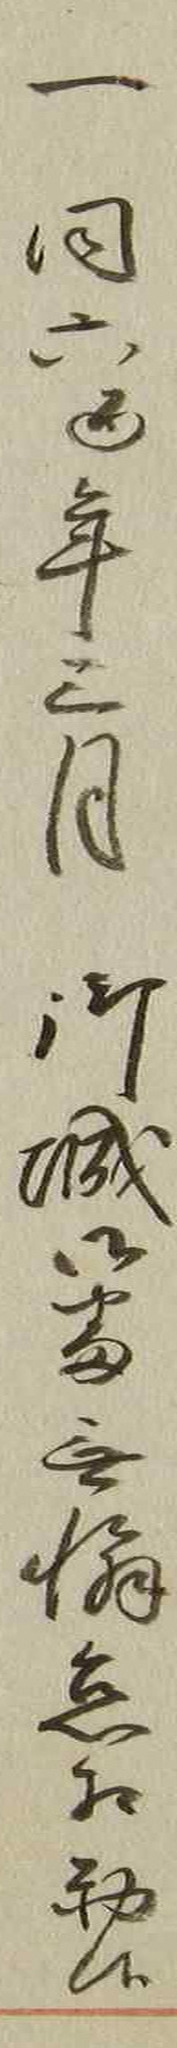一同六酉年三月御城御番無懈怠相勤候
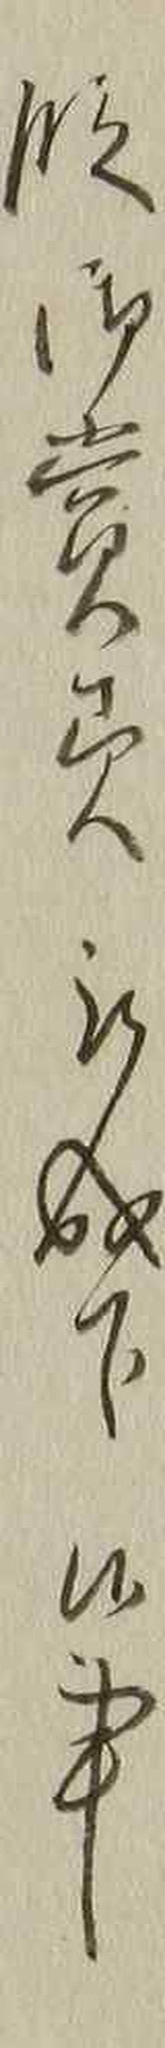段御賞美被成下候事
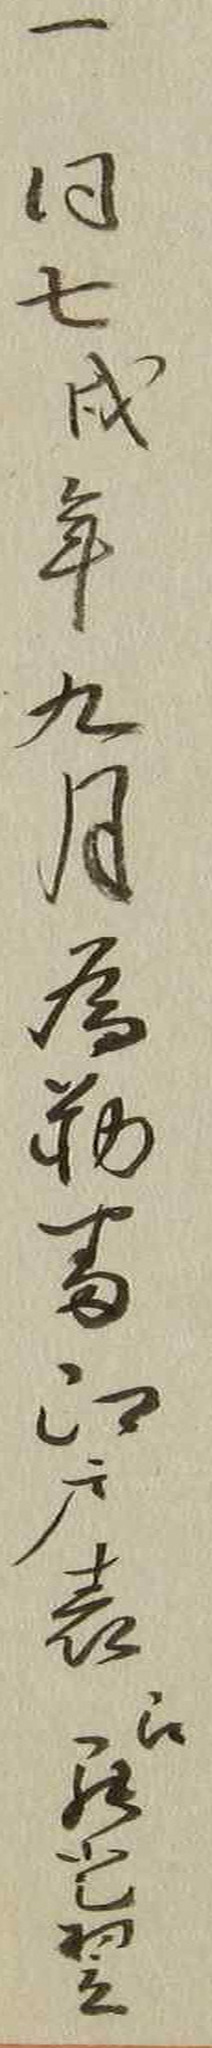一同七戌年九月為勤番江戸表江罷登翌
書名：諸士系譜　巻之122　よ之部5
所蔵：会津若松市立会津図書館
